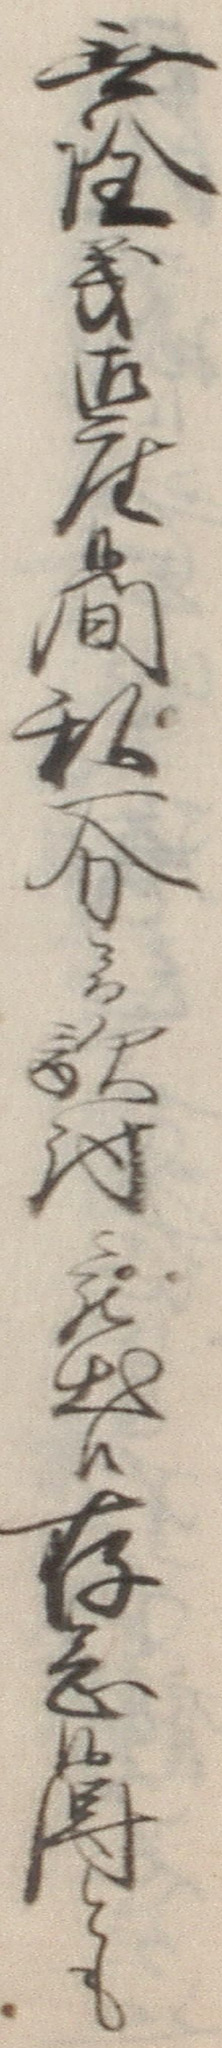無詮義御座候間私一分に而敵討被罷出候存念候得共
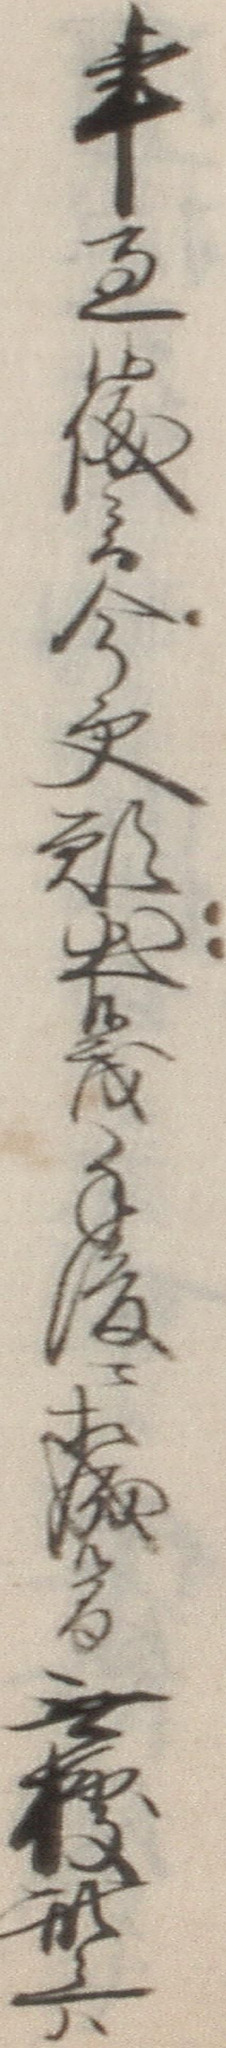事過候儀ニ而今更願出候も手後に相成候而無拠此上ハ
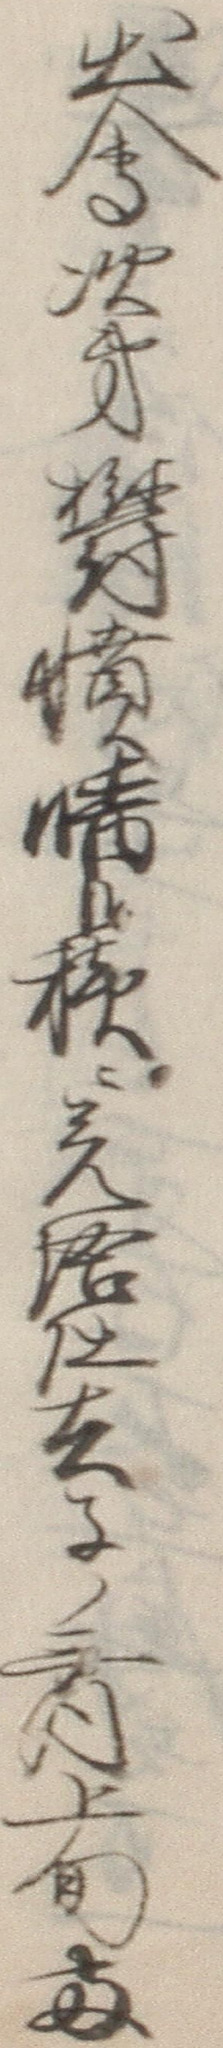出会次第鬱憤晴候積ニ覚悟仕去子ノ三月上旬両
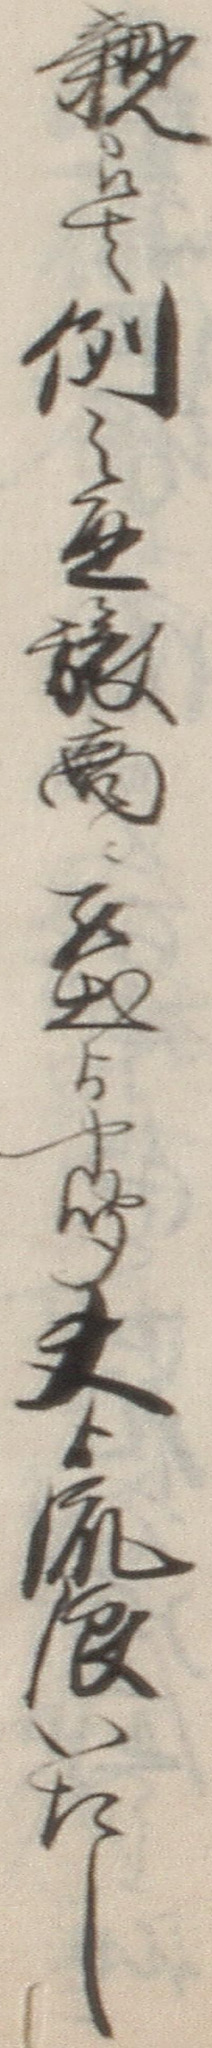親えは例の通旅商ニ罷出と申聞夫ゟ流浪いたし
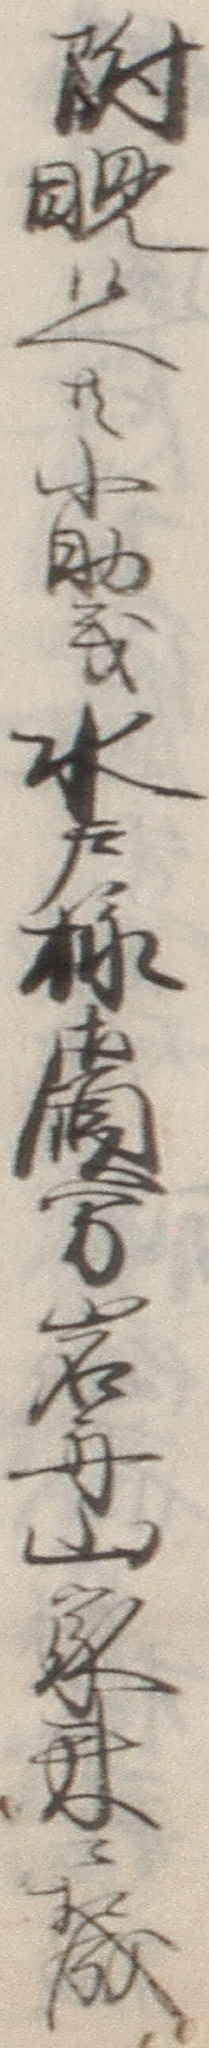附晛候へ共小助も水戸様御領分岩舟山家来ニ相成
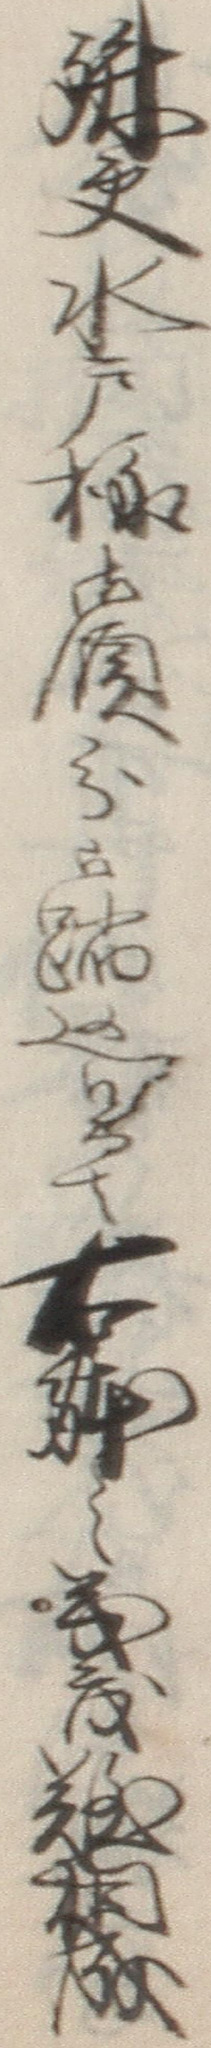殊更水戸様御領分え踏込候而は右躰の義も難相成
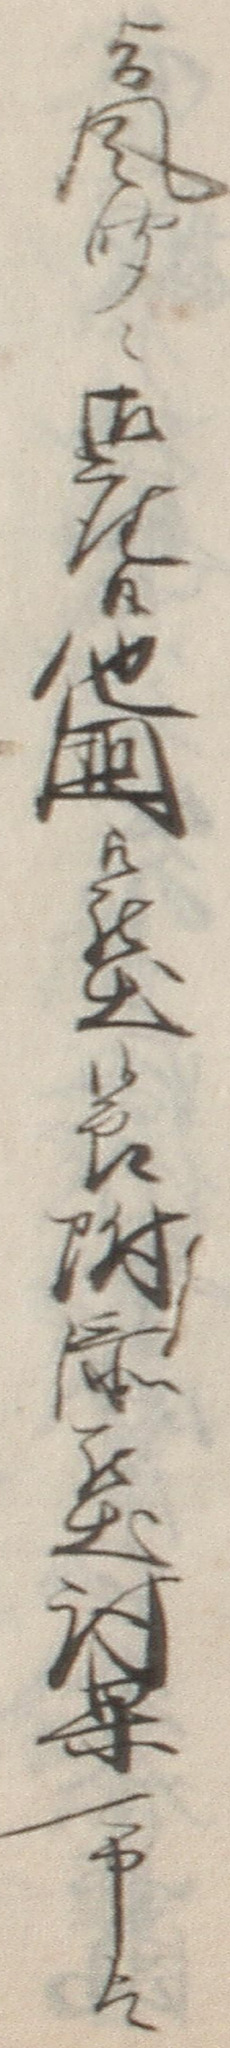旨風聞ニ御座候他国え罷出候節附添罷出打果可申と
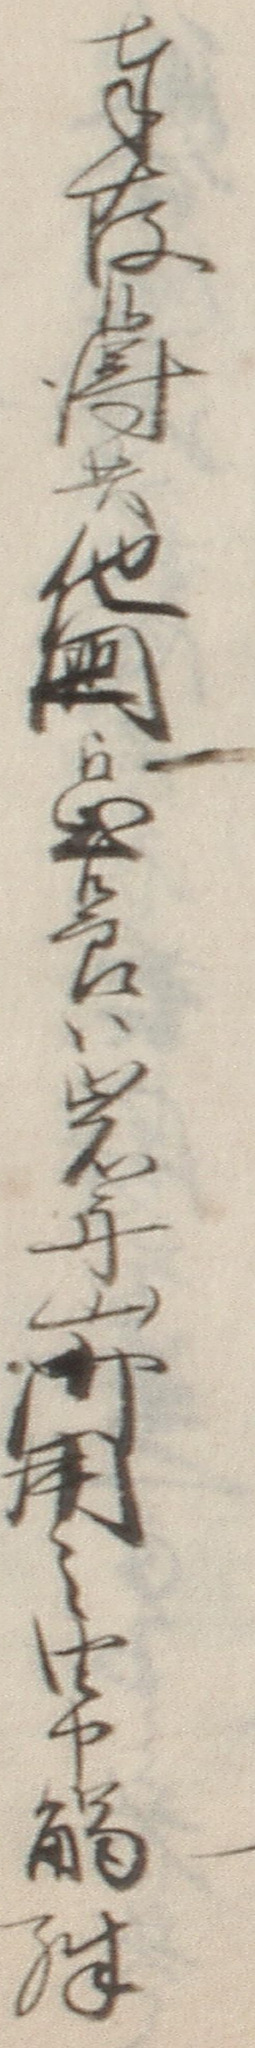奉存候得共他国え出候節ハ岩舟山御用の由申触殊
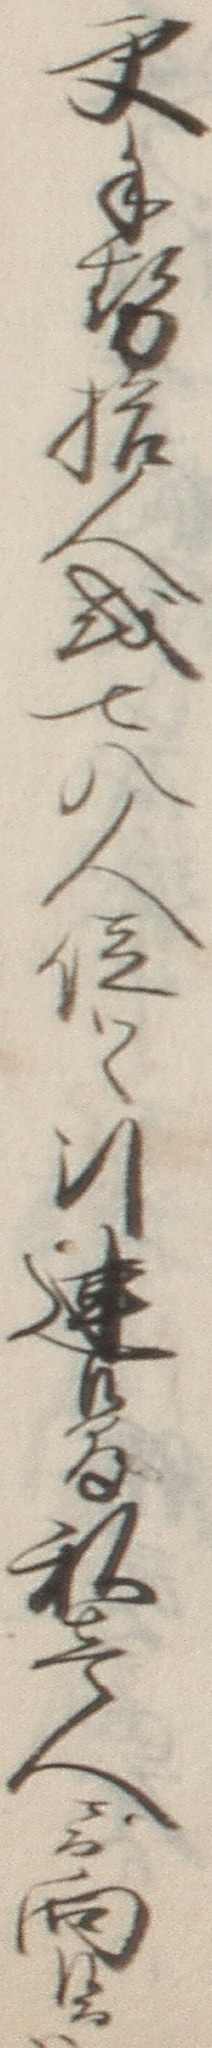更手勢拾人或七八人位ツヽ引連候間私壱人ニ而向候而ハ

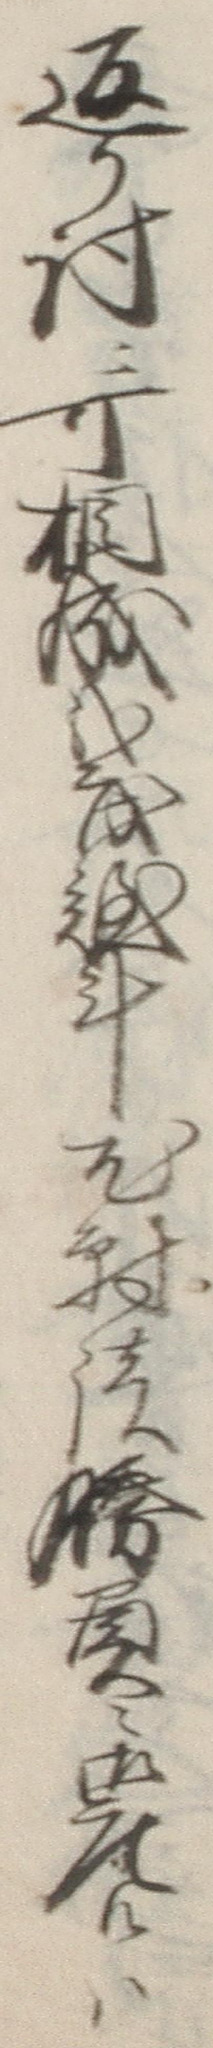返り討ニ可相成哉も難斗尤対決勝負ニ御座候ハ
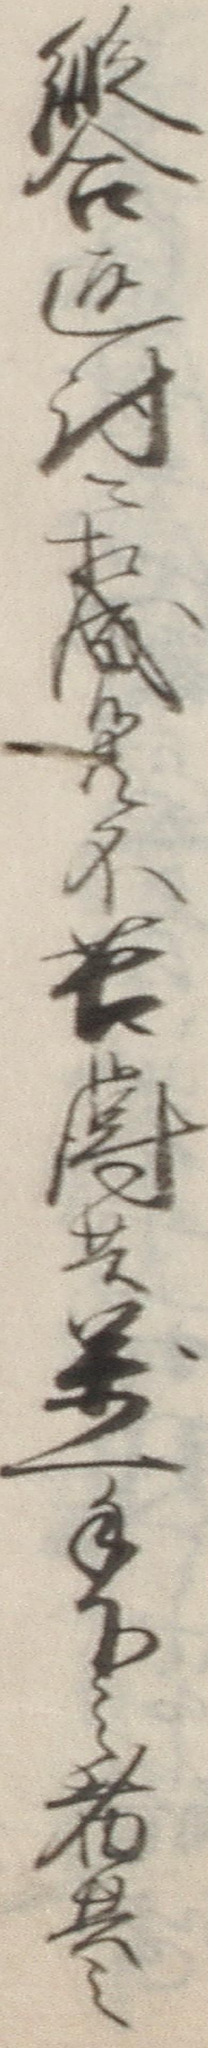縦令返討ニ相成候得共不苦候得共万一手下之者共之
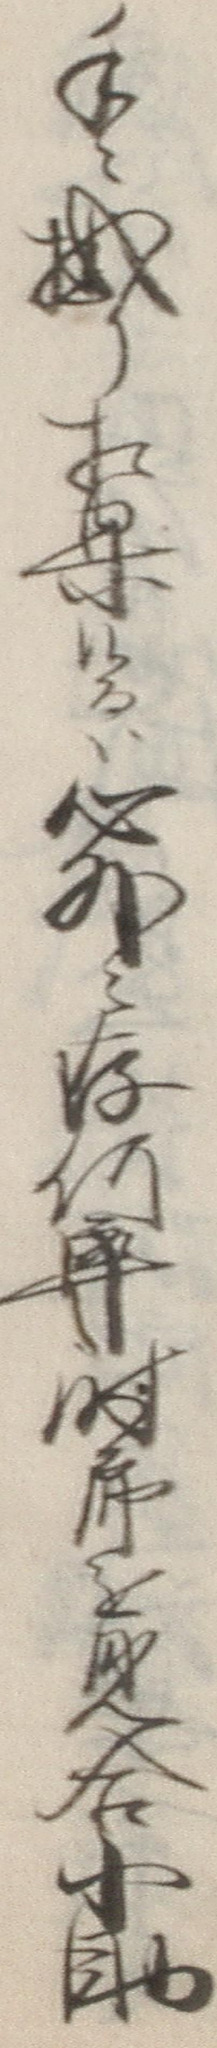手ニ掛り相果候而ハ必外ニ存何卒時節を見合小助
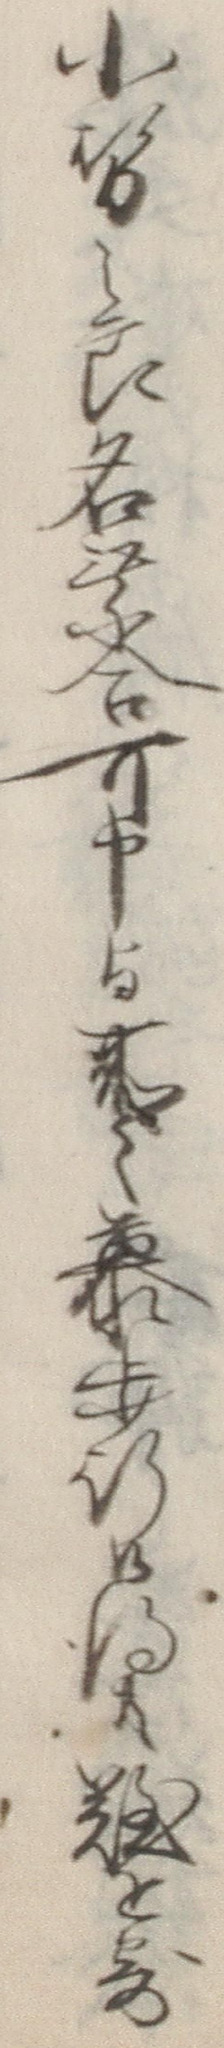小勢之節名乗合可申と所々慕歩行候得共難を寄
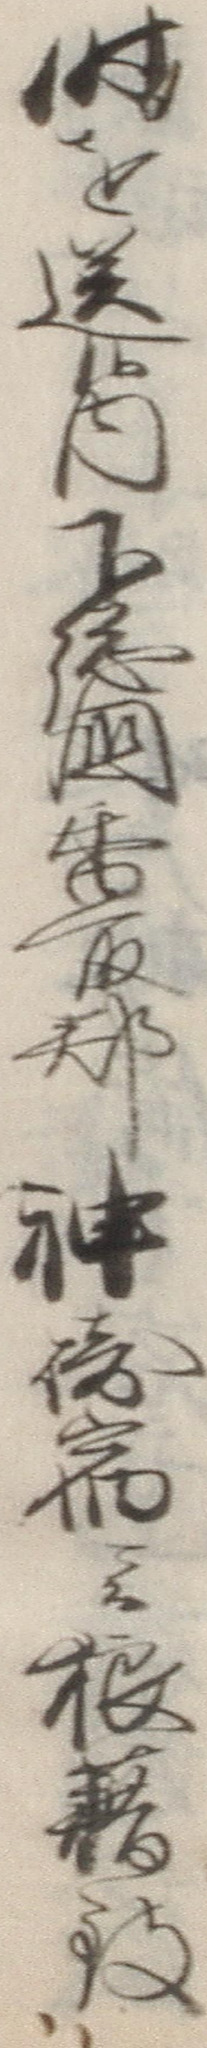時を送候内下総国香取郡神崎宿ニ而狼藉致
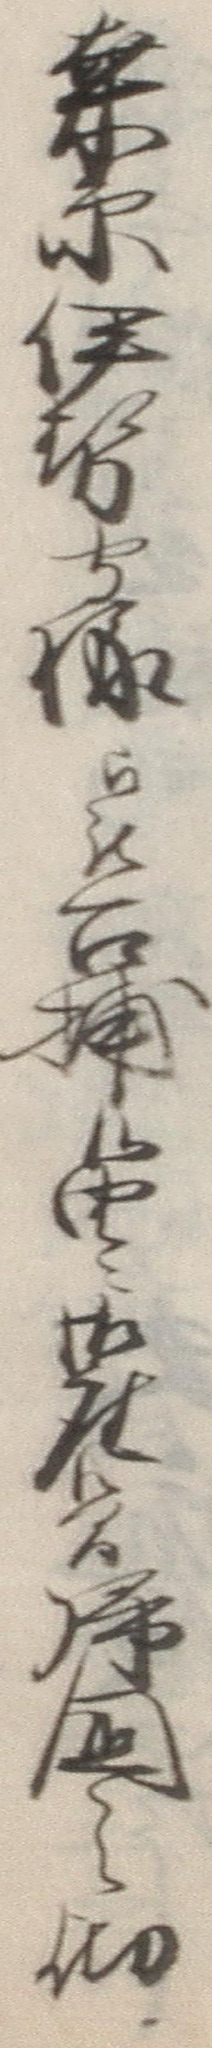桑原伊勢守様え被召捕候由ニ御座候間帰国之砌
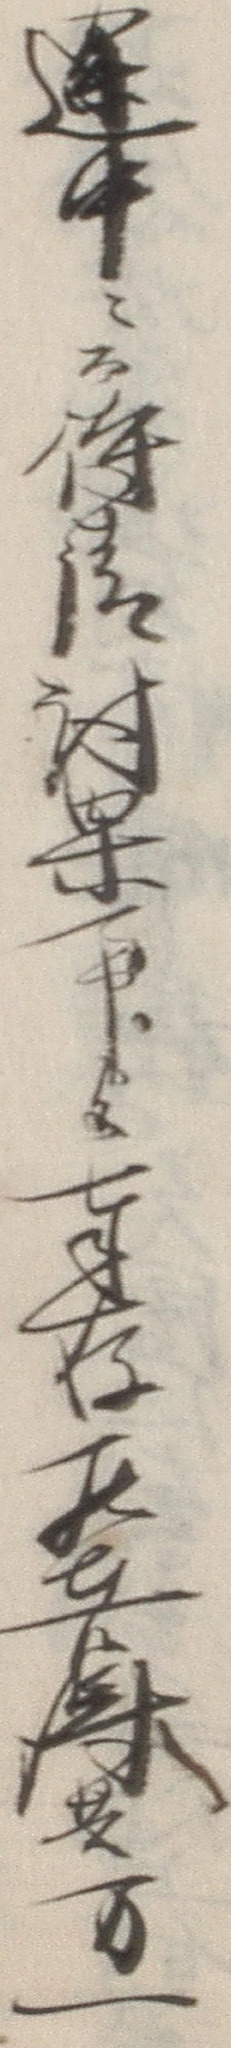途中ニ而待請討果可申と奉存罷在候得共万一
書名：[諸国災害記録]
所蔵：東京大学地震研究所図書室 Earthquake Research Institute Library, The University of Tokyo, JAPAN
